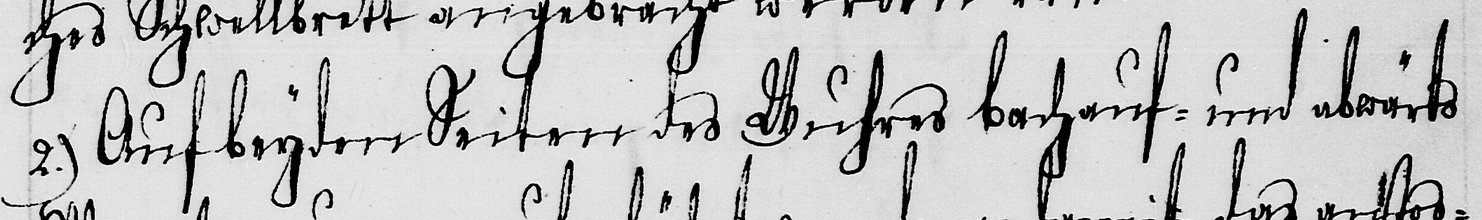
2.) Auf beyden Seiten des Wuhres bachauf- und abwärts
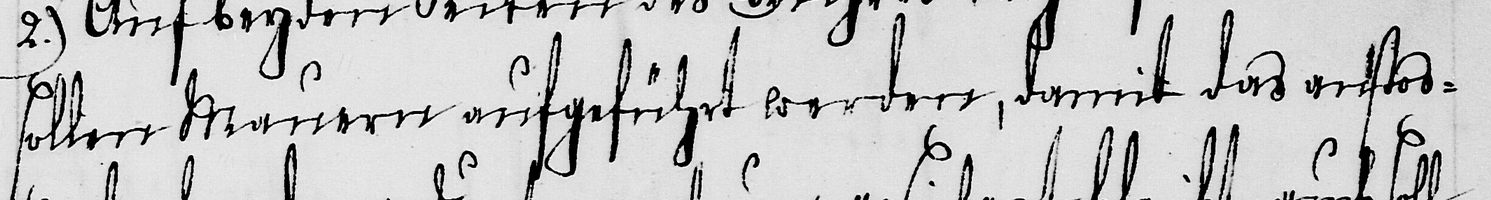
sollen Mauern aufgeführt werden, damit das anstoß¬
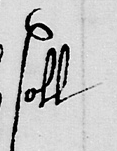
etzi¬
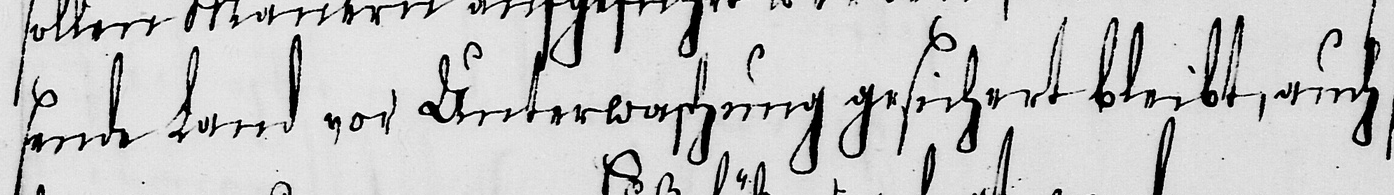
ende Land vor Unterwaschung gesichert bleibt, auch
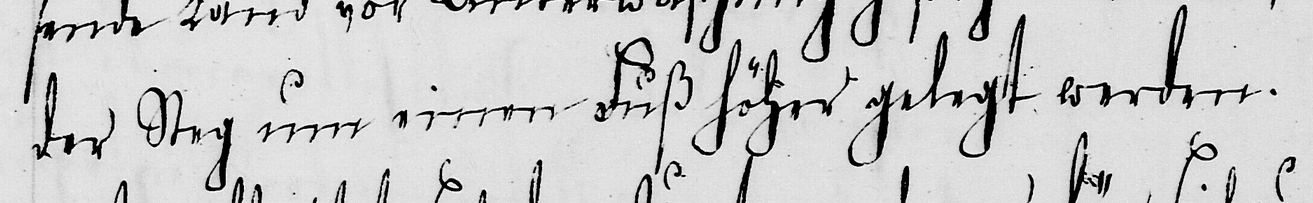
der Steg um einen Fuß höher gelegt werden.
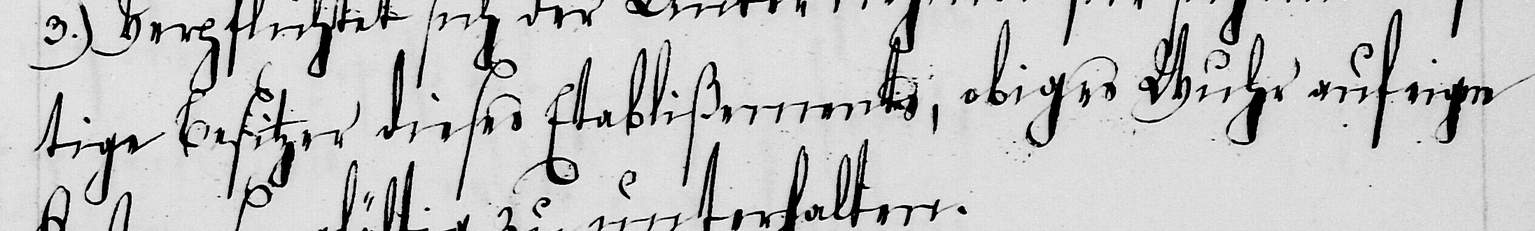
tige Besitzer dieses Etablißements, obiges Wuhr auf eigne
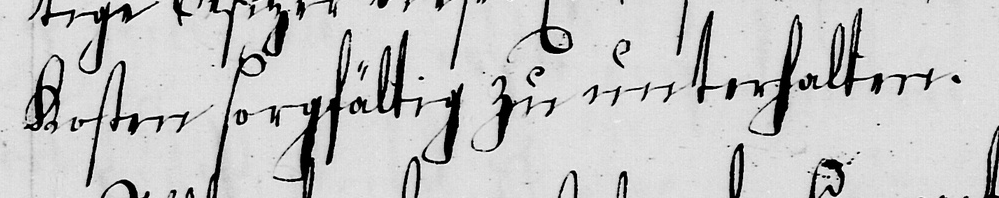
Kosten sorgfältig zu unterhalten.
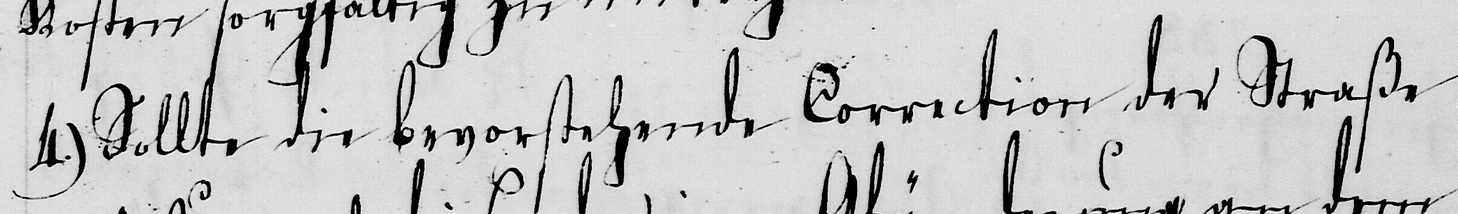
4.) Sollte die bevorstehende Correction der Straße
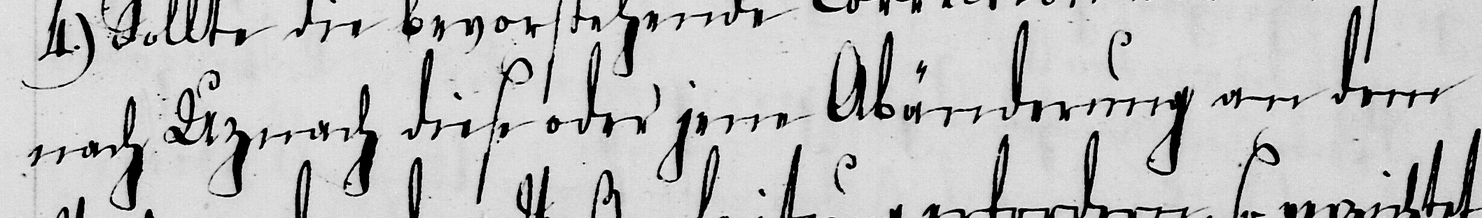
nach Uznach diese oder jene Abänderung an dem
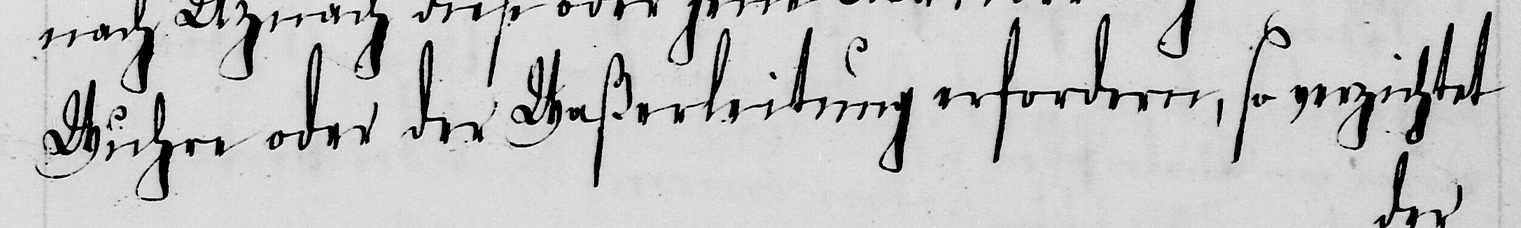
Wuhre oder der Waßerleitung erfordern, so verzichtet
